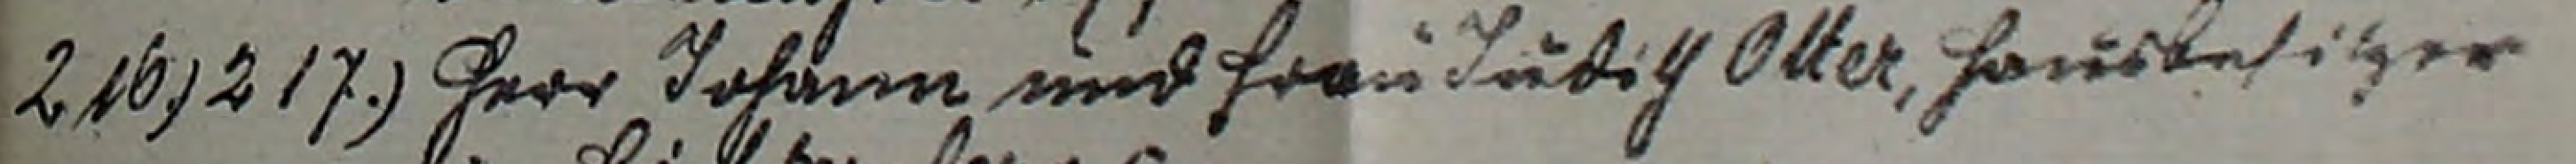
216.) 217.) Herr Johann und Frau Judith Otter, Hausbesitzer
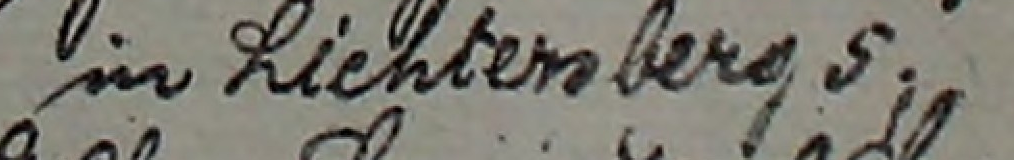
in Lichtersberg 5;
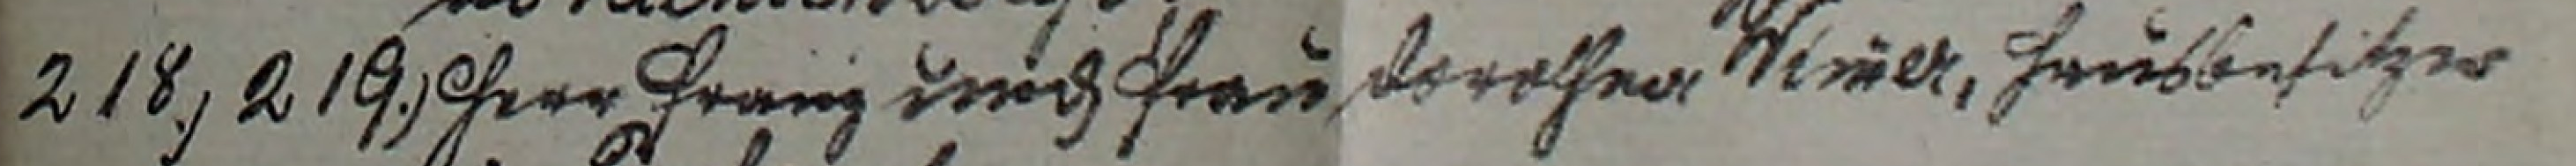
218.) 219.) Herr Franz und Frau Dorothea Wimmer, Hausbesitzer
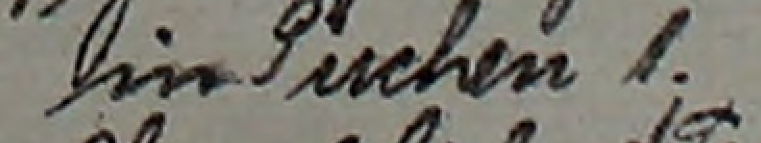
in Puchen 1;
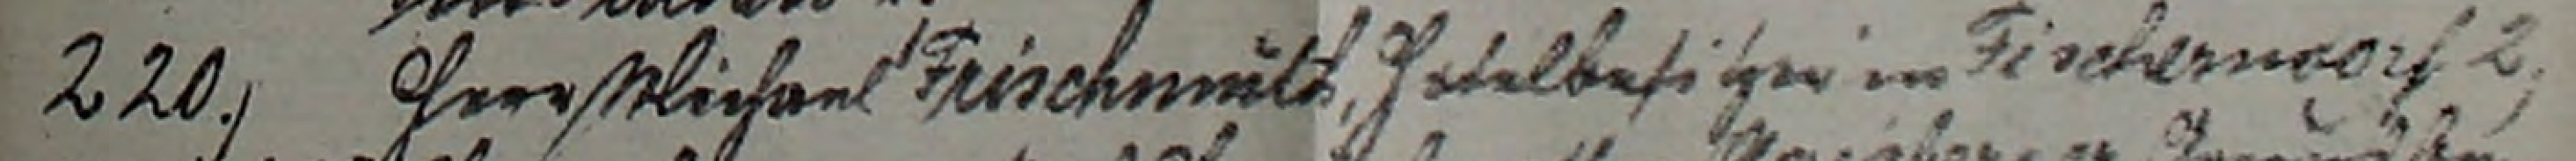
220.) Herr Michael Frischmuth, Hotelbesitzer in Fischerndorf 2;
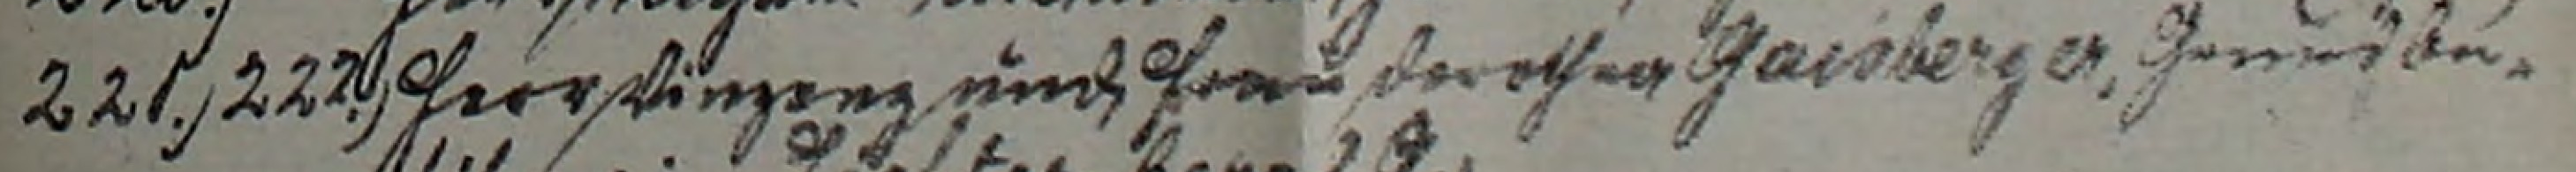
221.) 222.) Herr Vinzenz und Frau Dorothea Gaisberger, Grundbe„
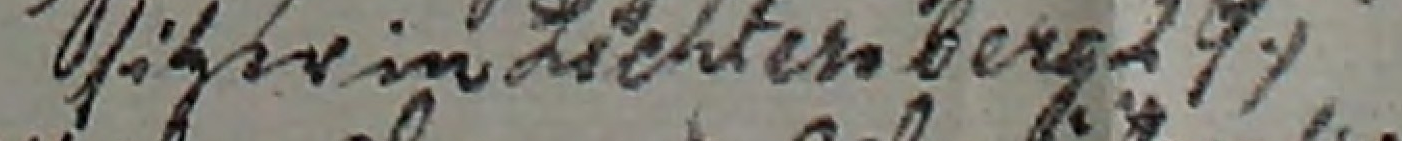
sitzer in Lichtersberg 29;
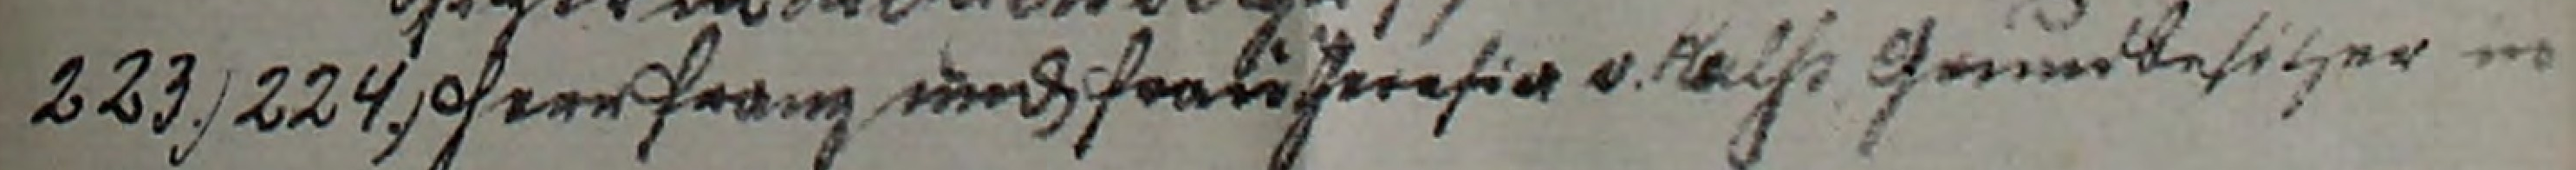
223.) 224.) Herr Franz und Frau Theresia v. Kalhs Grundbesitzer in
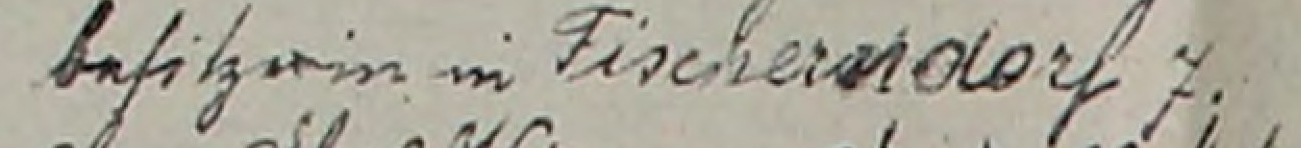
besitzerin in Fischerndorf 7;
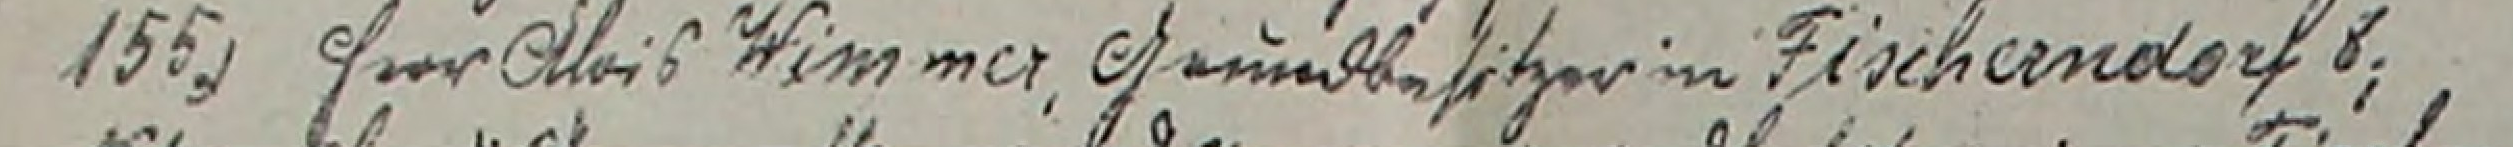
155.) Herr Alois Wimmer, Grundbesitzer in Fischerndorf 8;
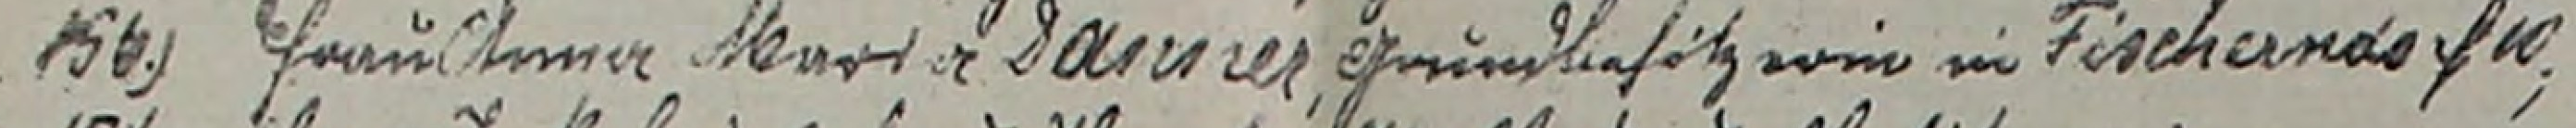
156.) Frau Anna Maria Danner, Grundbesitzerin in Fischerndorf 10;
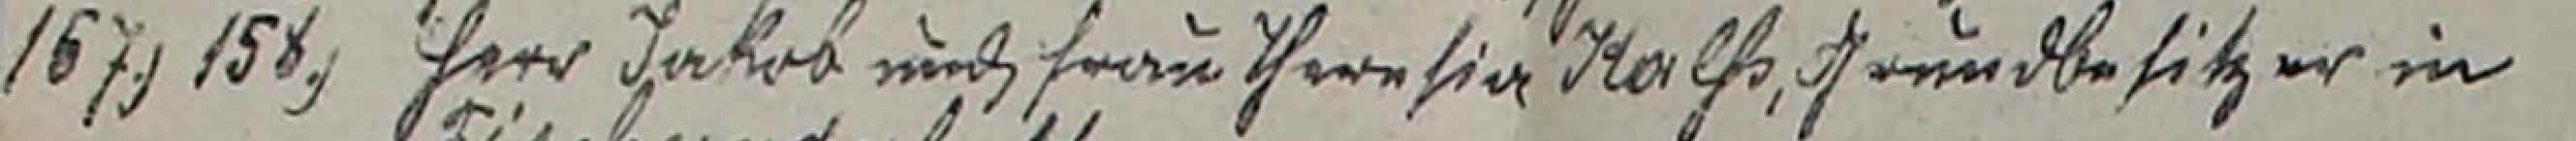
157.) 158.) Herr Jakob und Frau Theresia Kalhs, Grundbesitzer in
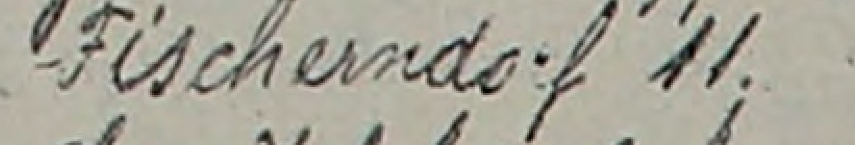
Fischerndorf 11.
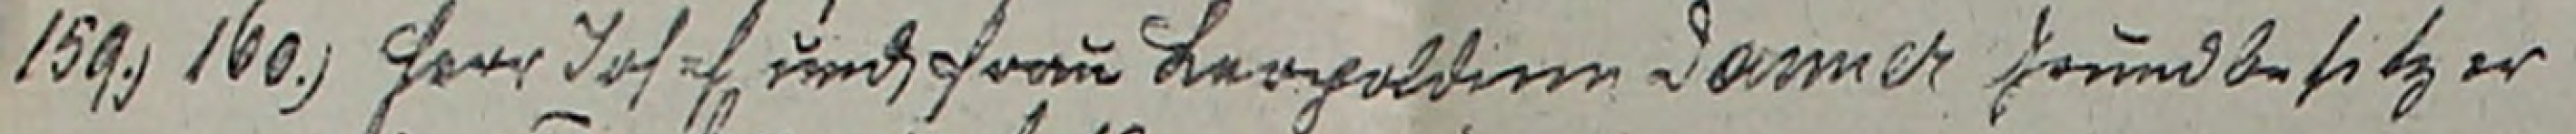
159.) 160.) Herr Josef und Frau Leopoldine Danner Grundbesitzer
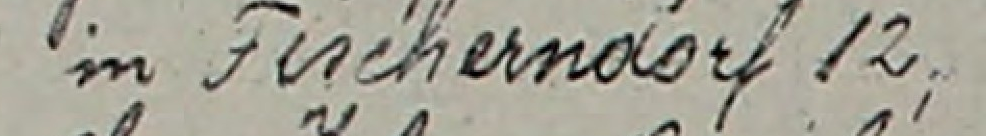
in Fischerndorf 12;
